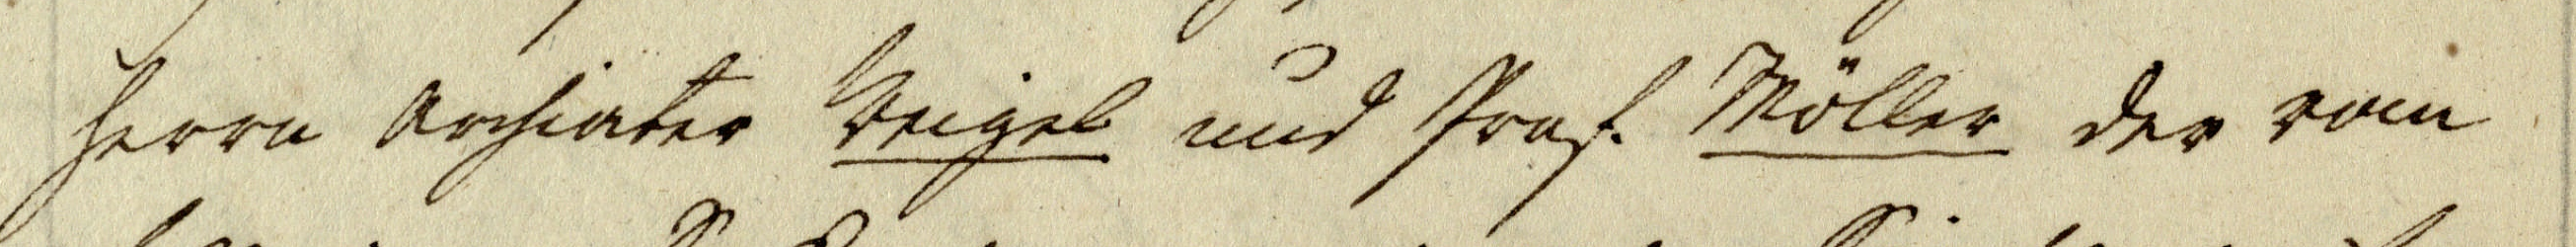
Herrn Archiater Weigel und Prof. Möller der vom
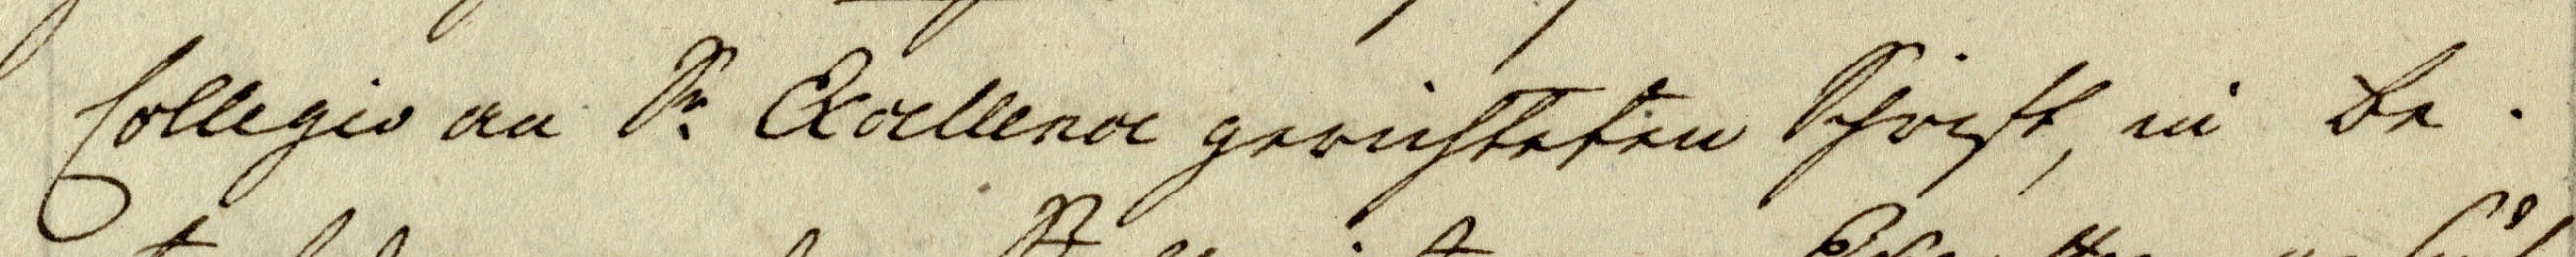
Collegio an Sr. Excellence gerichteten Schrift, in Be¬
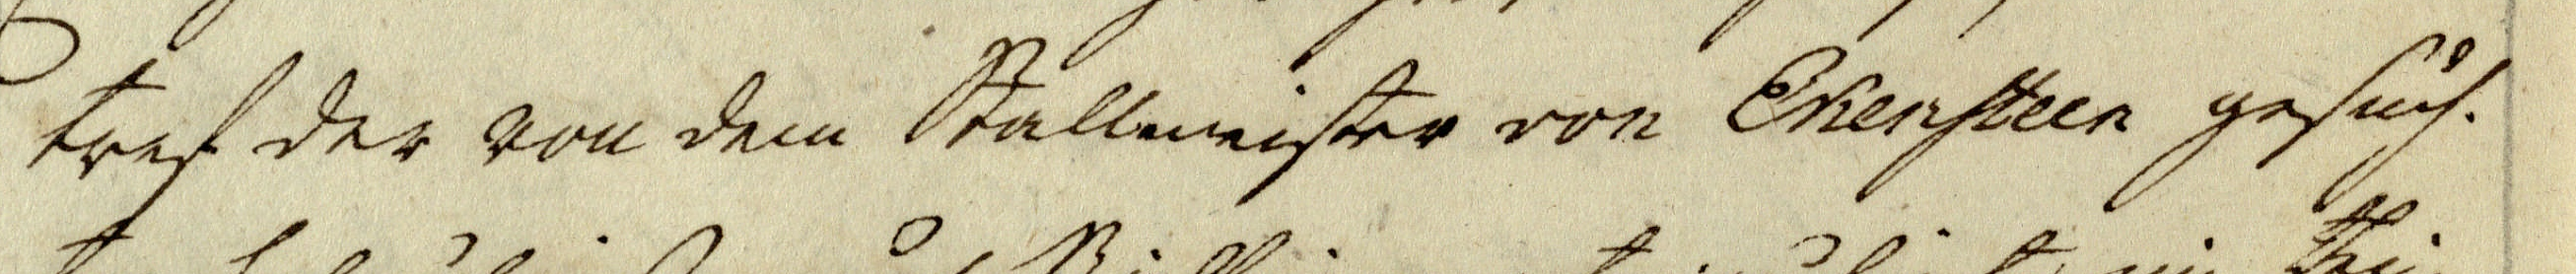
tref der von dem Stallmeister von Ekensteen gesuch¬
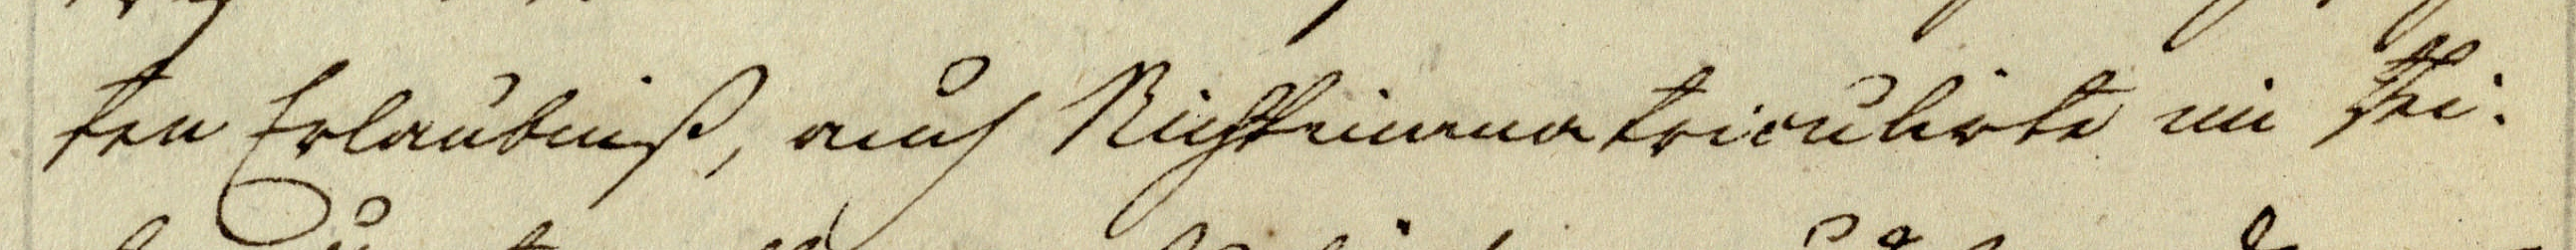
ten Erlaubnis, auch Nichtimmatriculirte im Rei¬
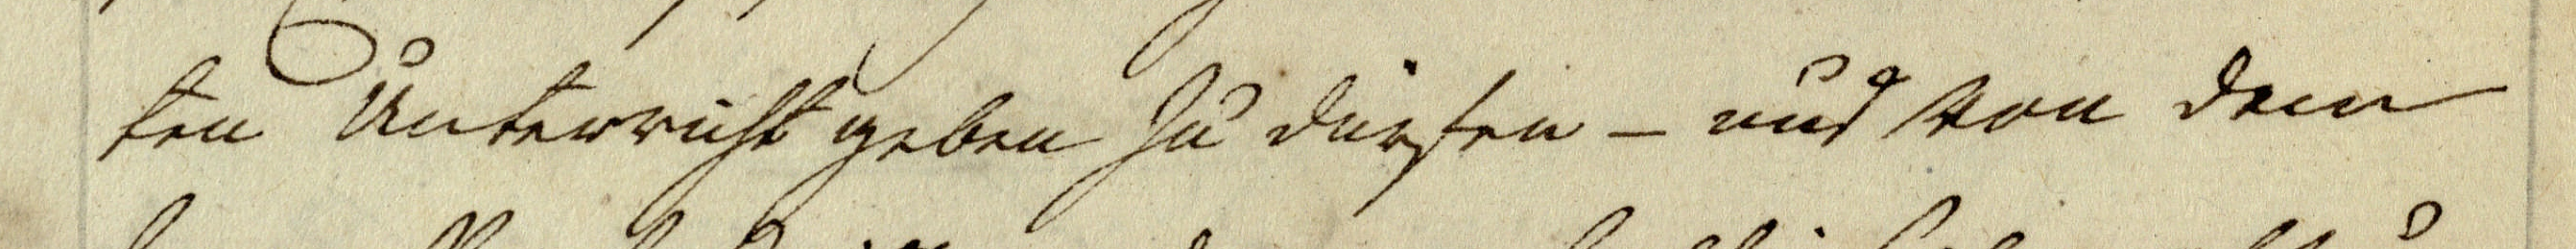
ten Unterricht geben zu dürfen - und von dem
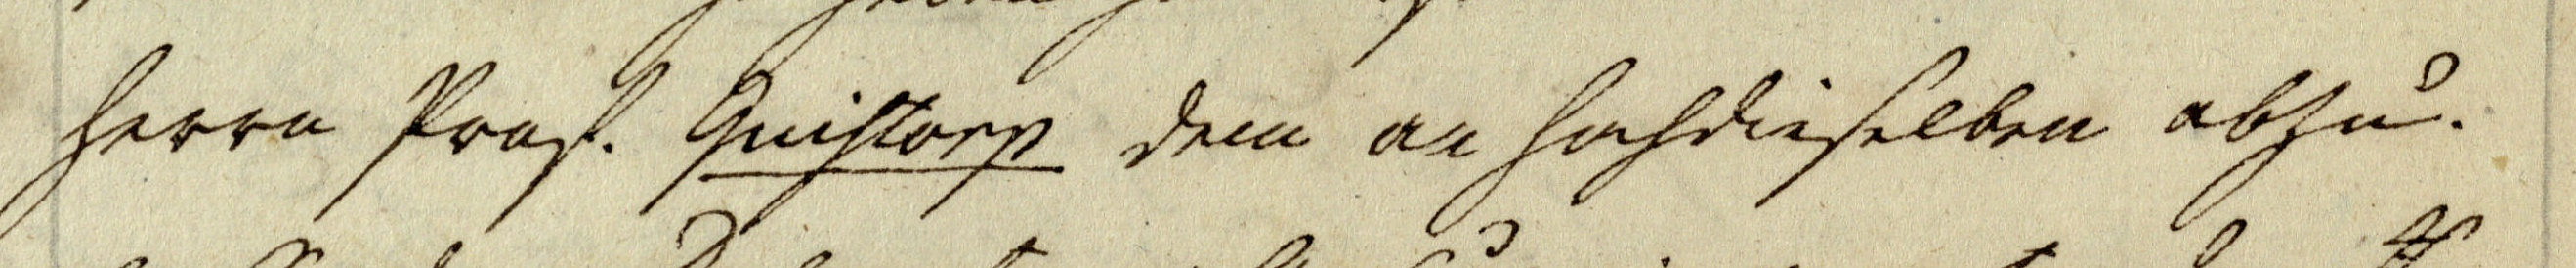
Herrn Prof. Quistorp dem an hochdieselben abzu¬
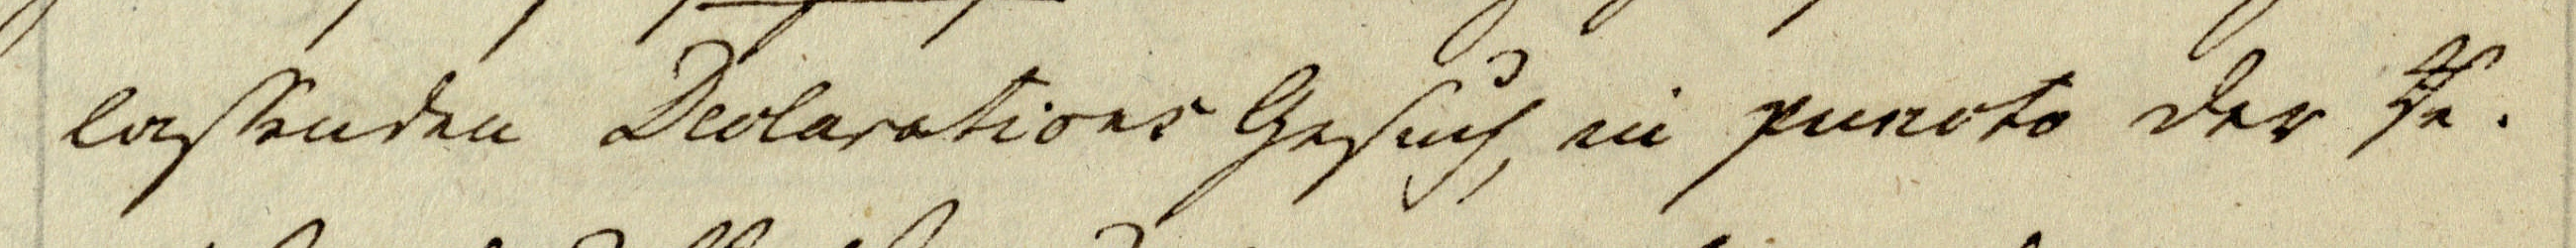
lassenden Declarations Gesuch, in puncto der Re¬
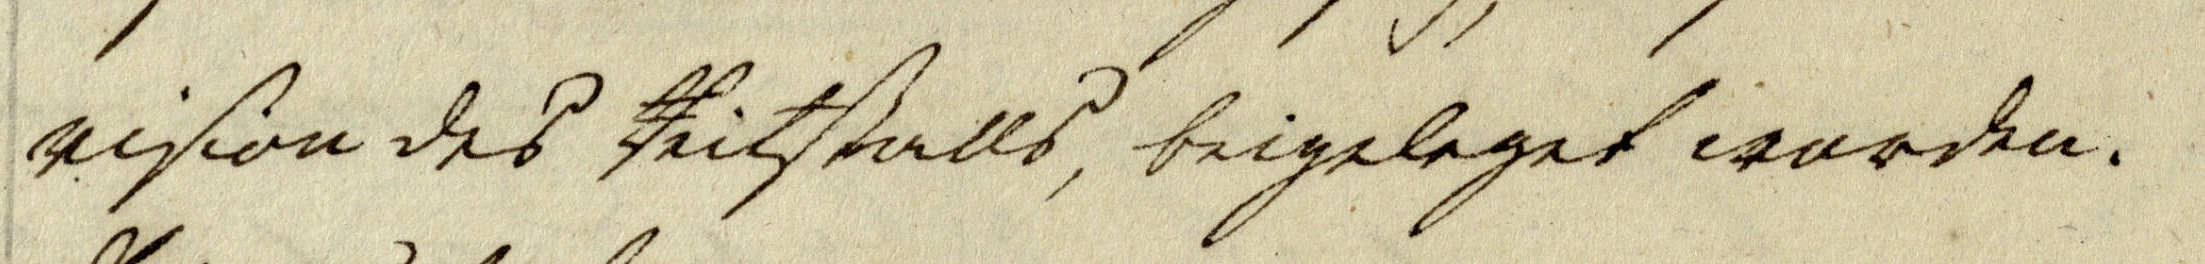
vision des Reitstalls, beigeleget worden.
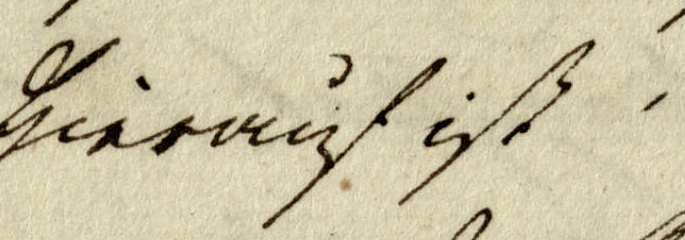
Hierauf ist
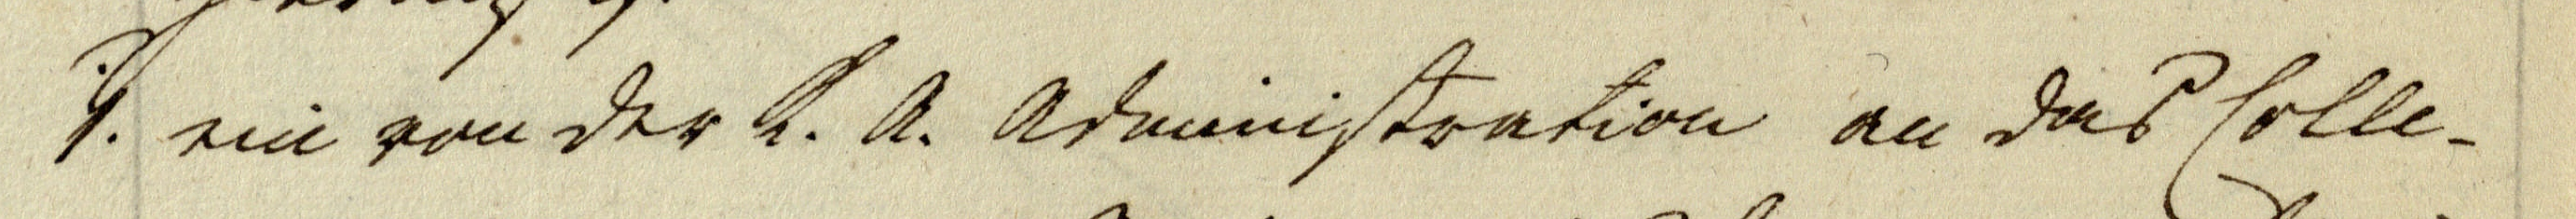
1. ein von der K. A. Administration an das Colle¬
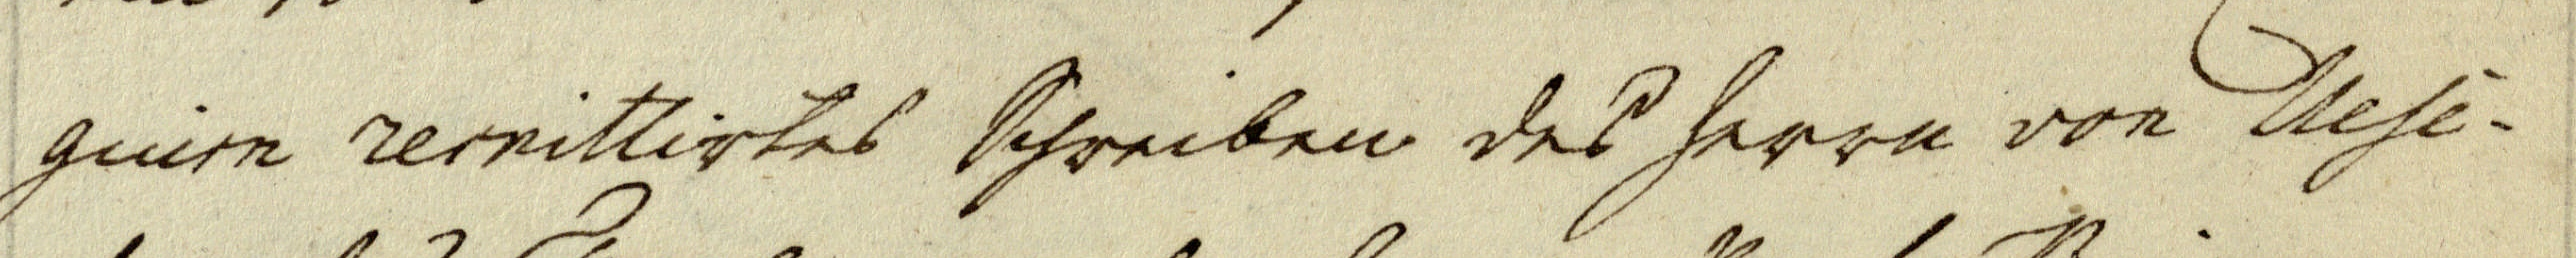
gium remittirtes Schreiben des Herrn von Uese¬
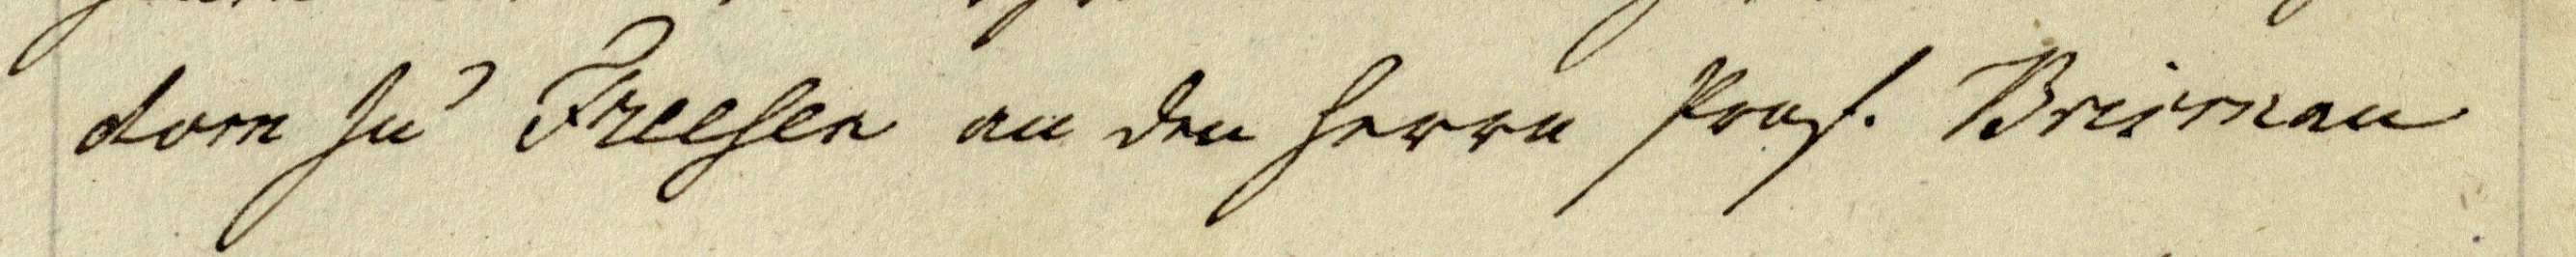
dom zu Freesen an den Herrn Prof. Brisman
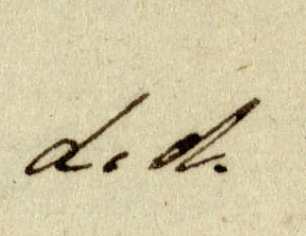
d. d.
